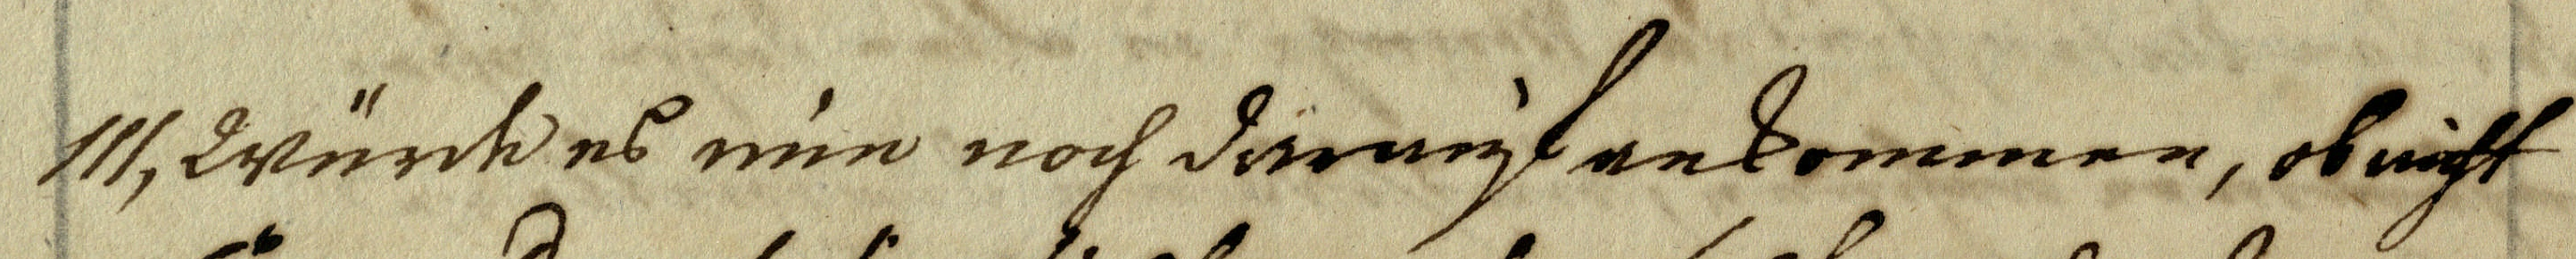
III, Würde es nun noch darauf ankommen, ob nicht
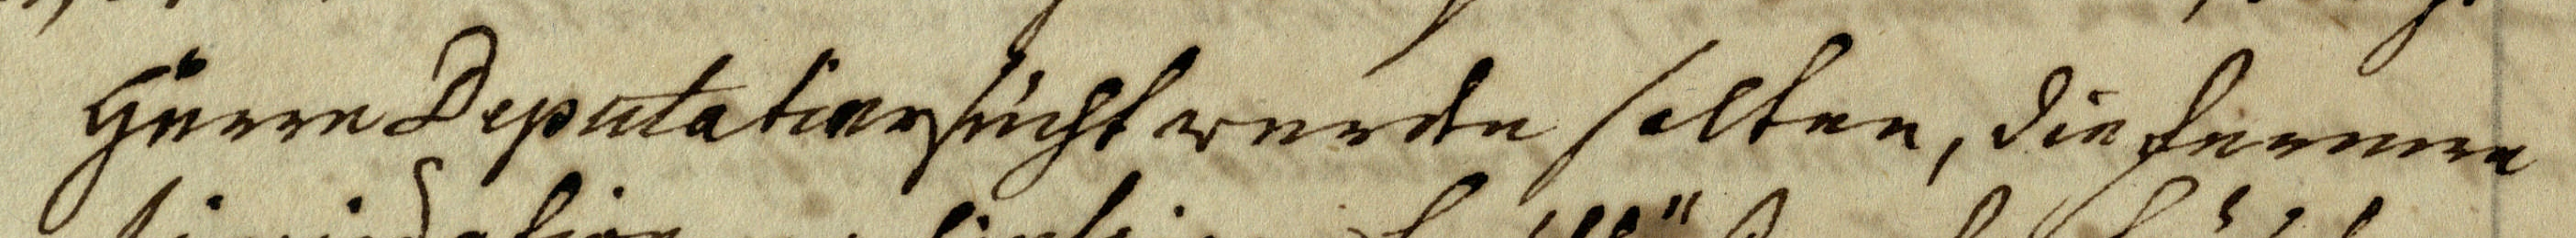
Herrn Deputati ersucht werden solten, die fernere
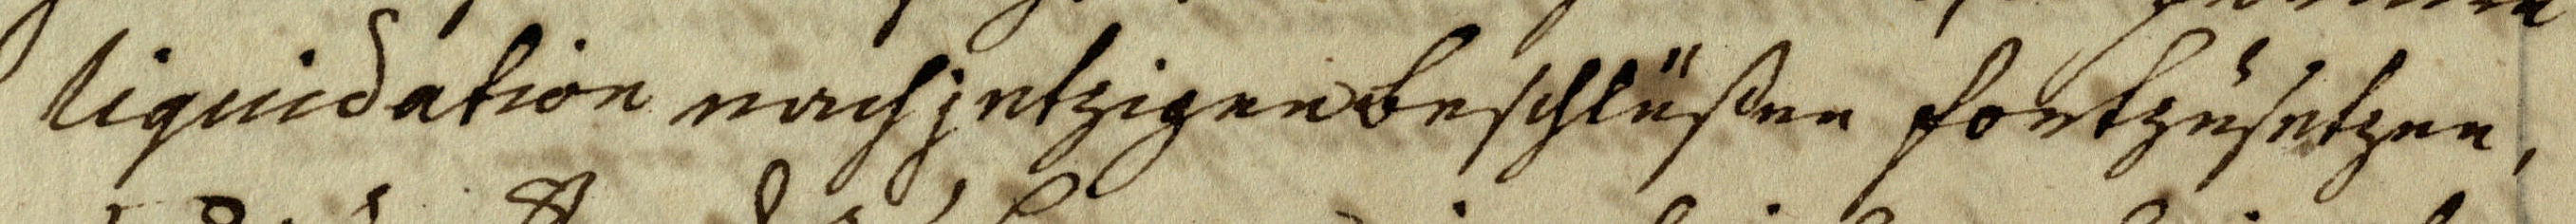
liquidation nach jetzigen Beschlüßen fortzusetzen,
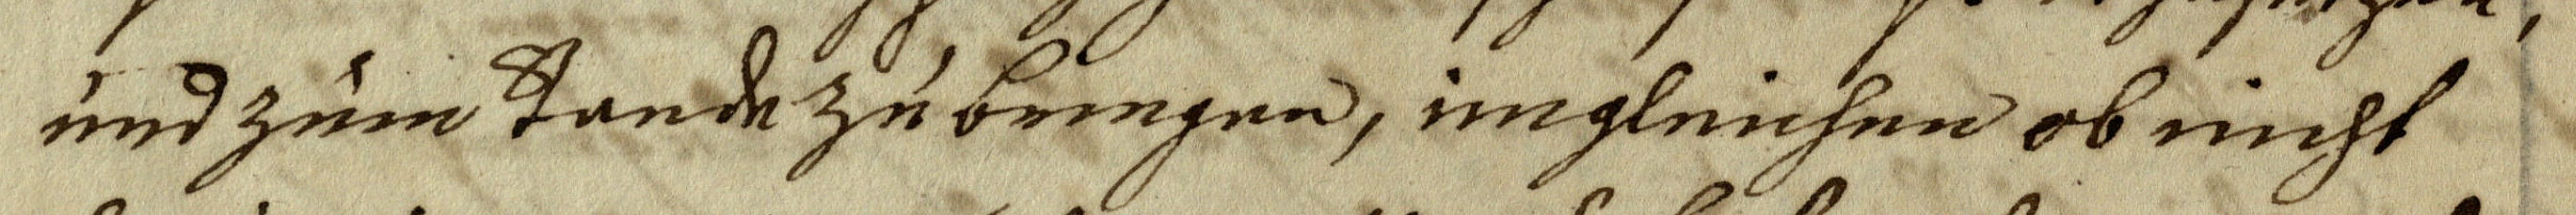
und zum Stande zu bringen, imgleichen ob nicht
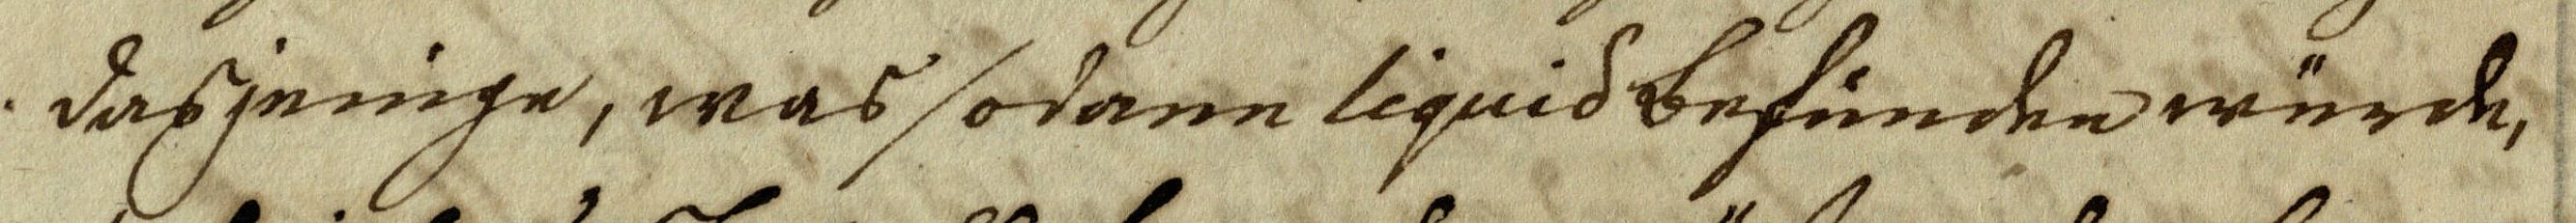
dasjenige, was sodann liquid befunden würde,
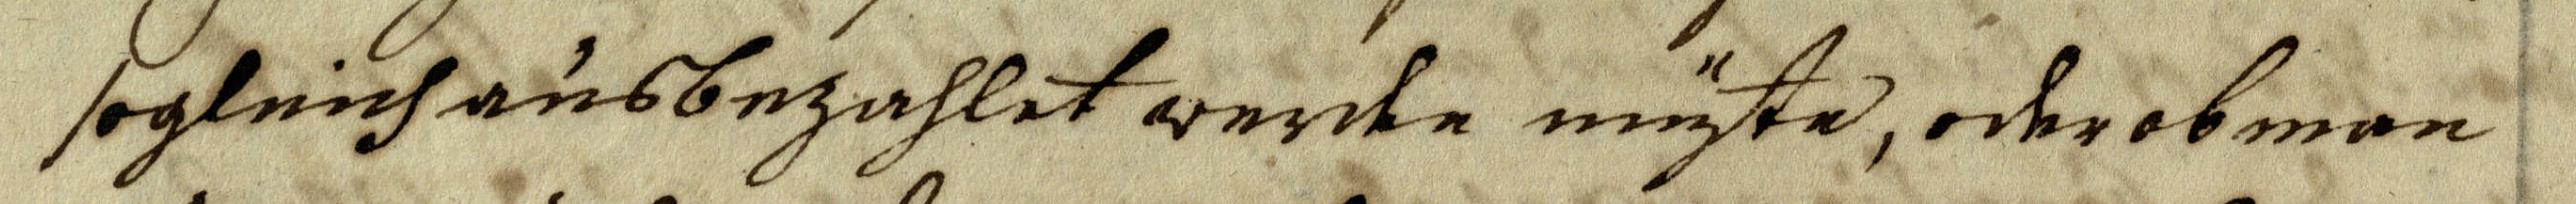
sogleich ausbezahlet werden müßte, oder ob man
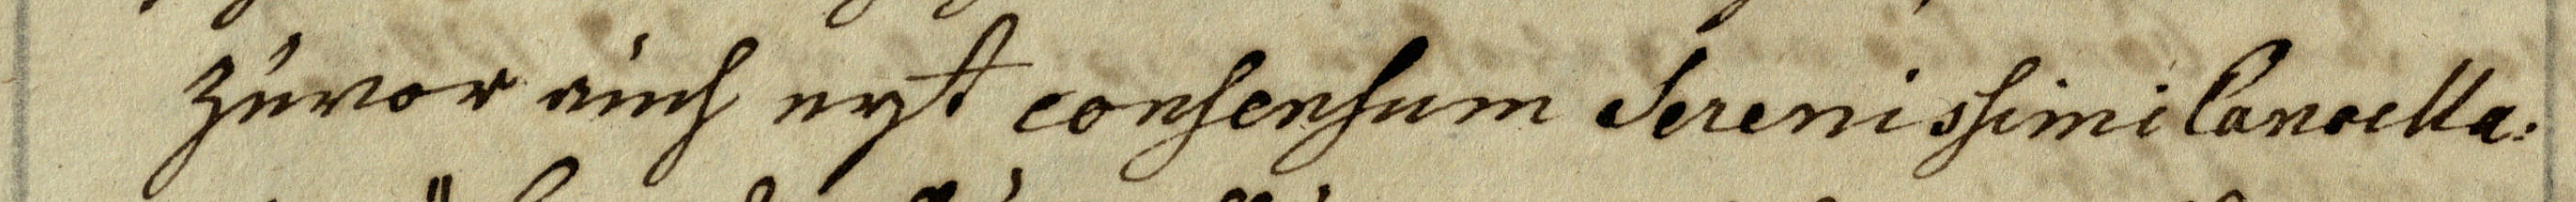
zuvor auch erst consensum Seremissimi Cancella¬
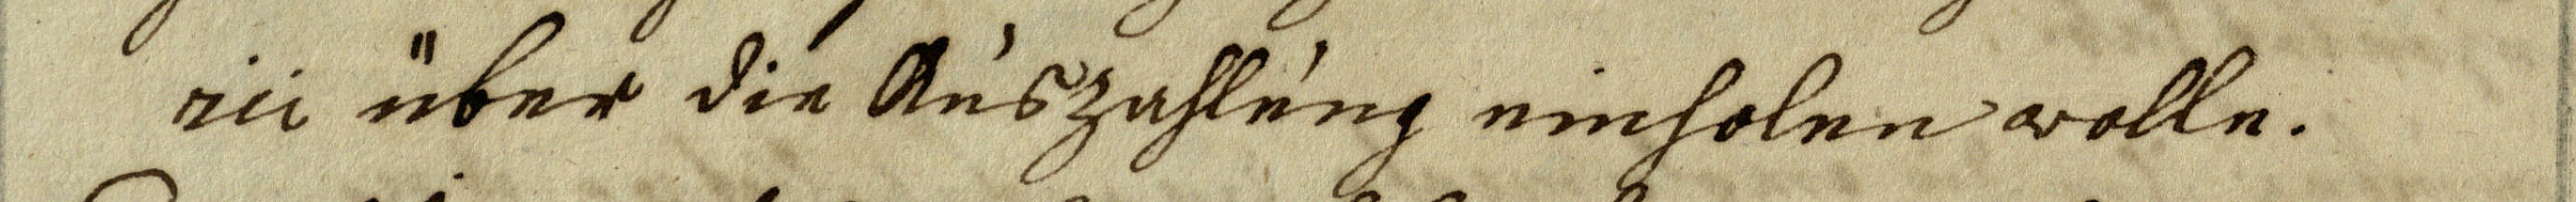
rii über die Auszahlung einholen wolle.
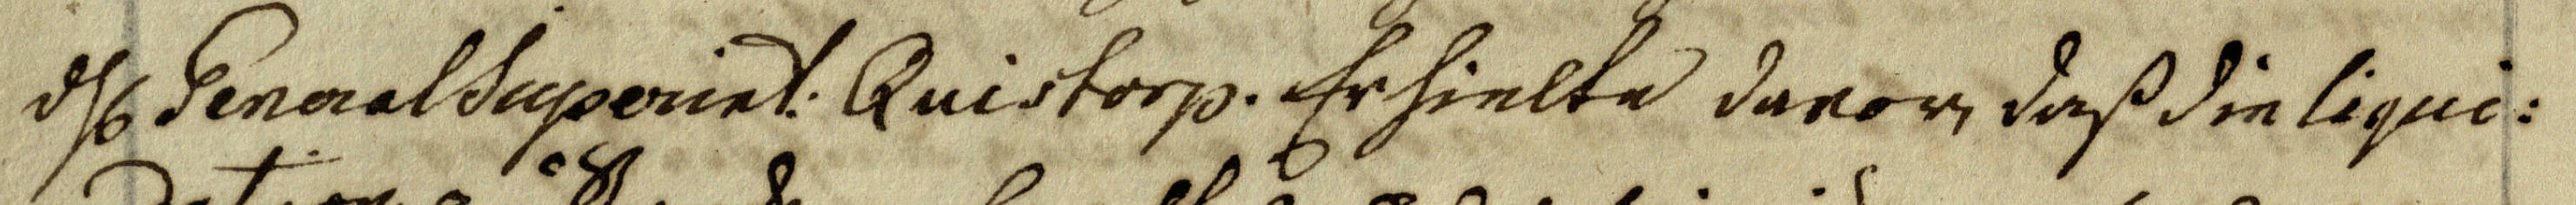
dh GeneralSuperint. Quistorp. Er hielte davor, daß die liqui¬
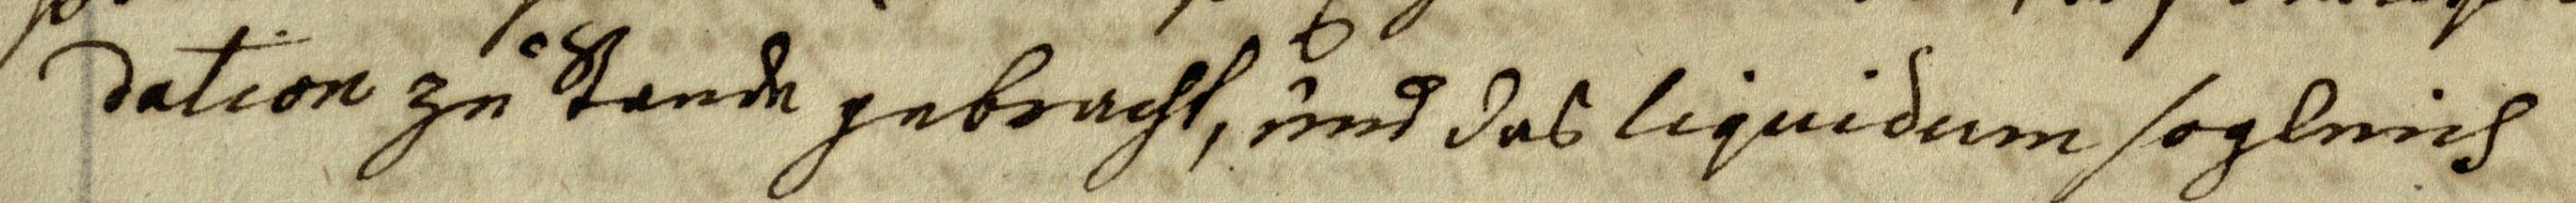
dation zu Stande gebracht, und das liquidum sogleich
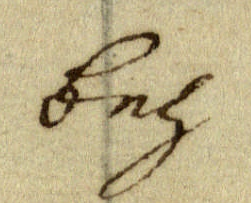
bez
